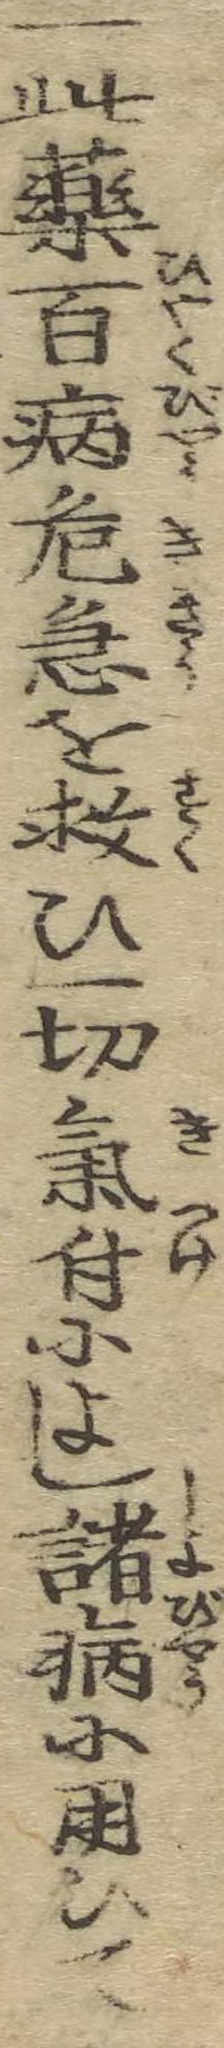一此薬百病危急を救ひ一切気付によし諸病に用ひて
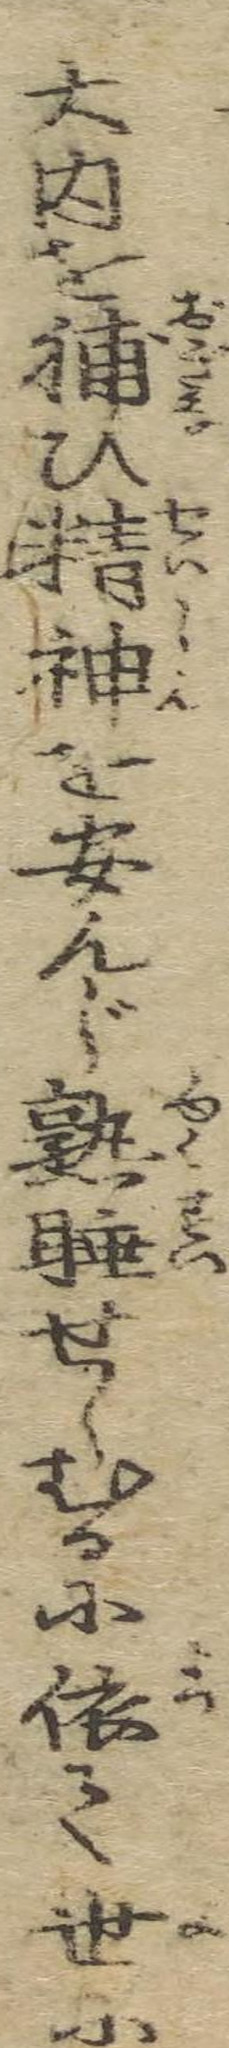大内を補ひ精神を安んじ熟睡せしむるに依て世に
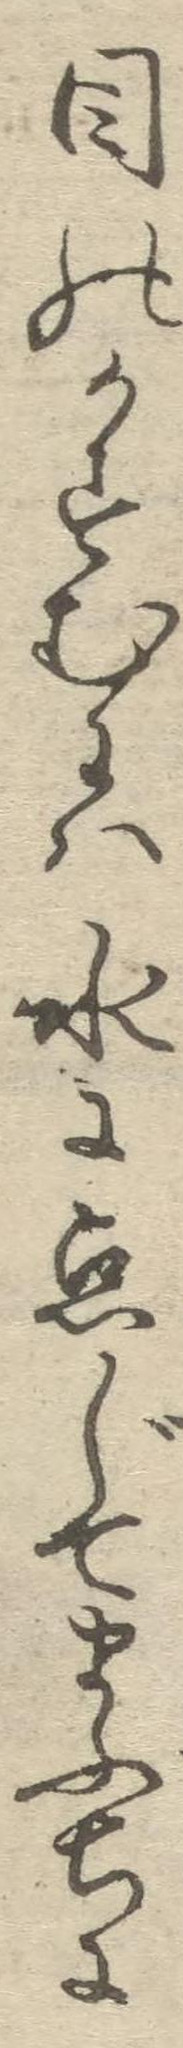目のかすむには水に点じてまぶちに
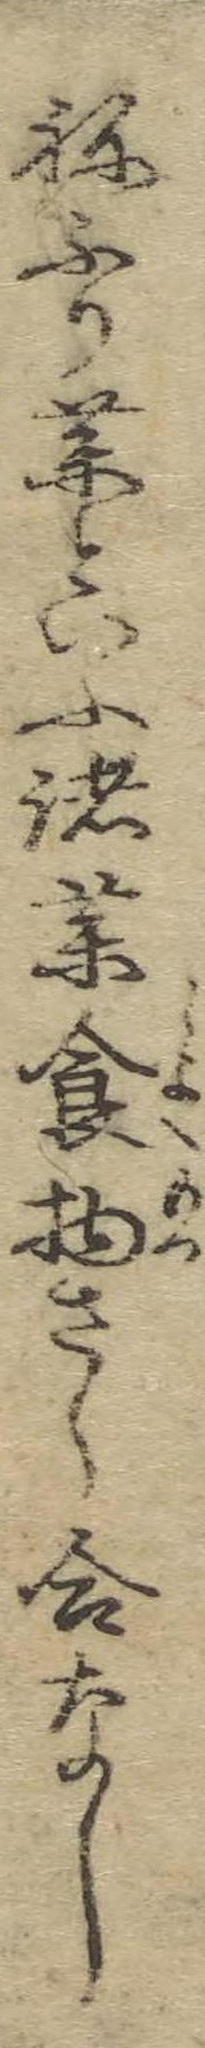ねふり薬といふ諸薬食物さし合なし
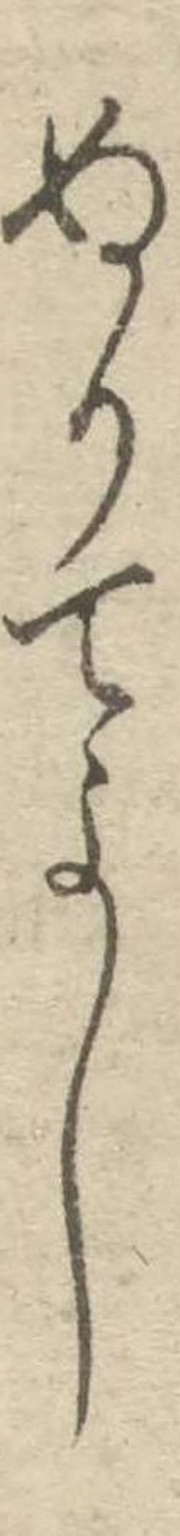ぬりてよし
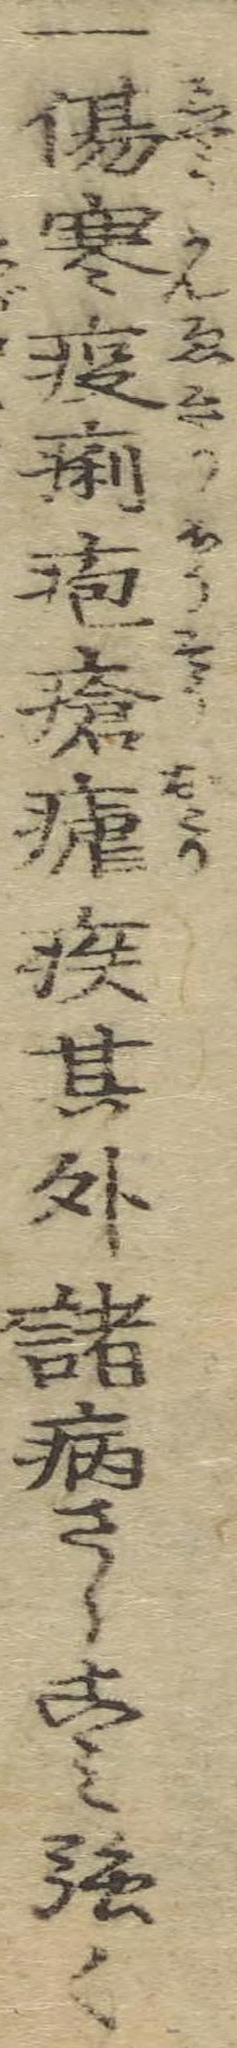一傷寒疫痢疱瘡瘧疾其外諸病さしこみ強く
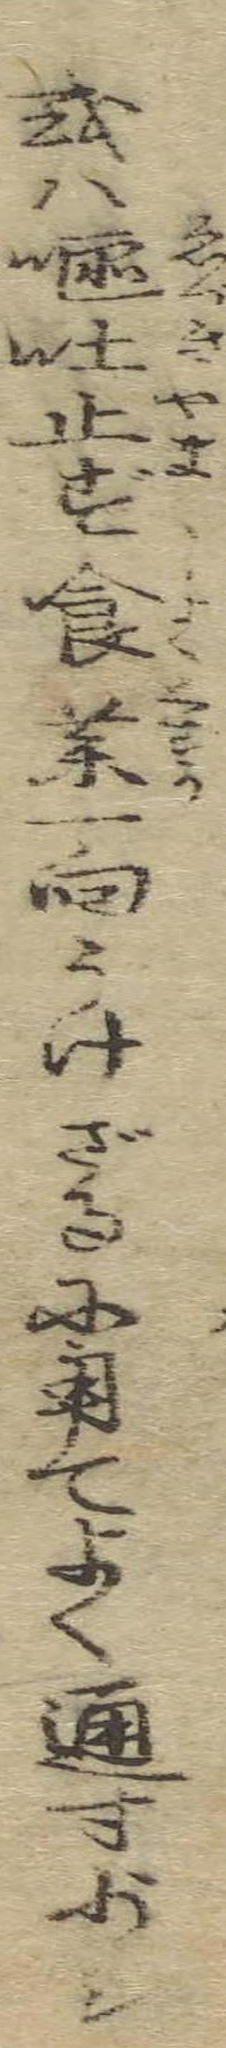或は嘔吐止ず食薬一向うけざるに用てよく通す少し
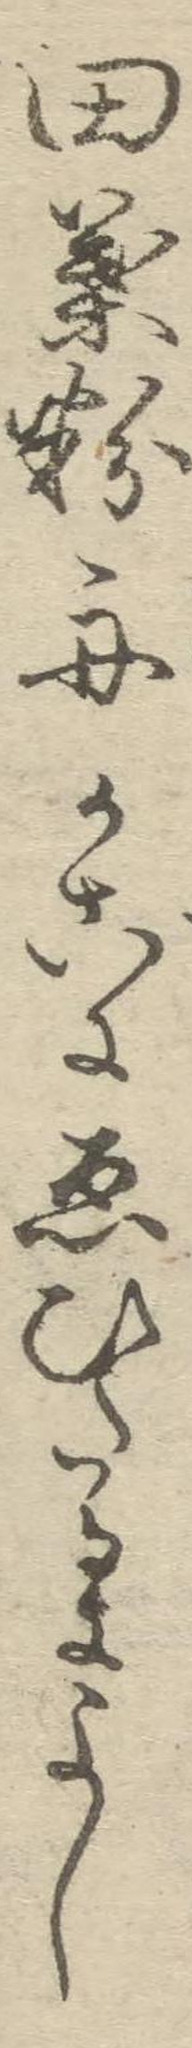田葉粉舟かごにゑひたるによし
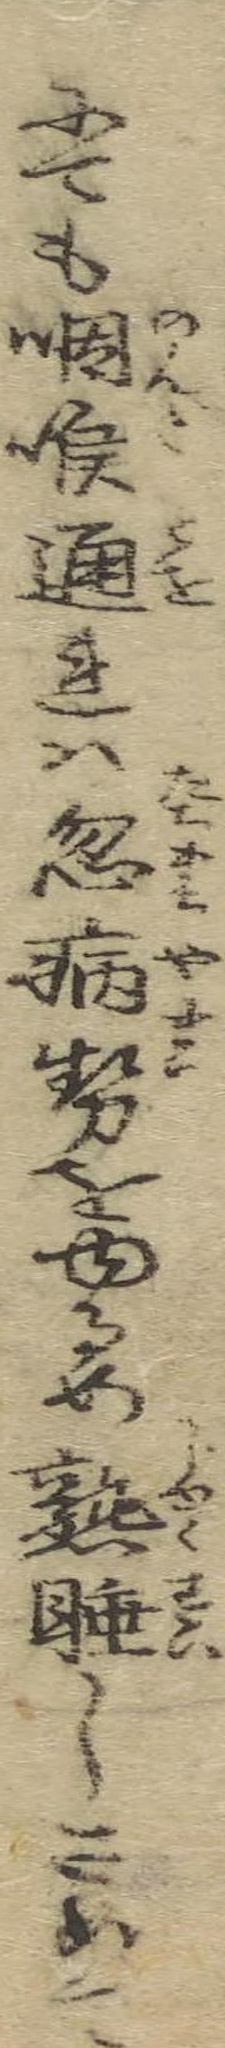にても咽喉通れは忽病勢をゆるめ熟睡しさめて
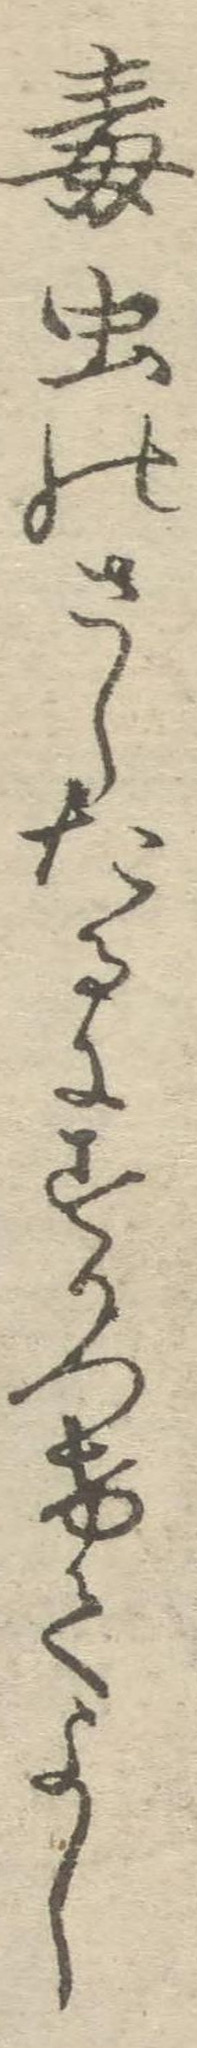毒虫のさしたるにすりつけてよし
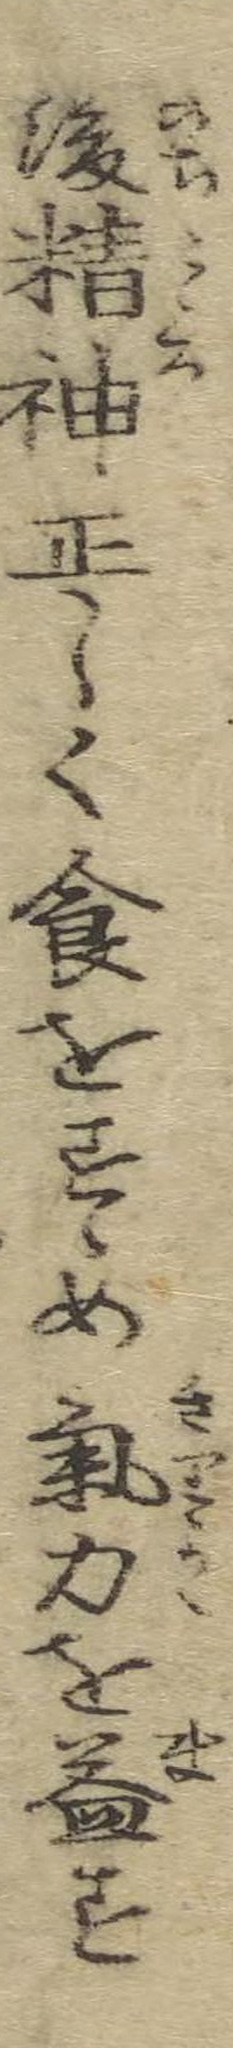後精神正しく食をすゝめ気力を益す
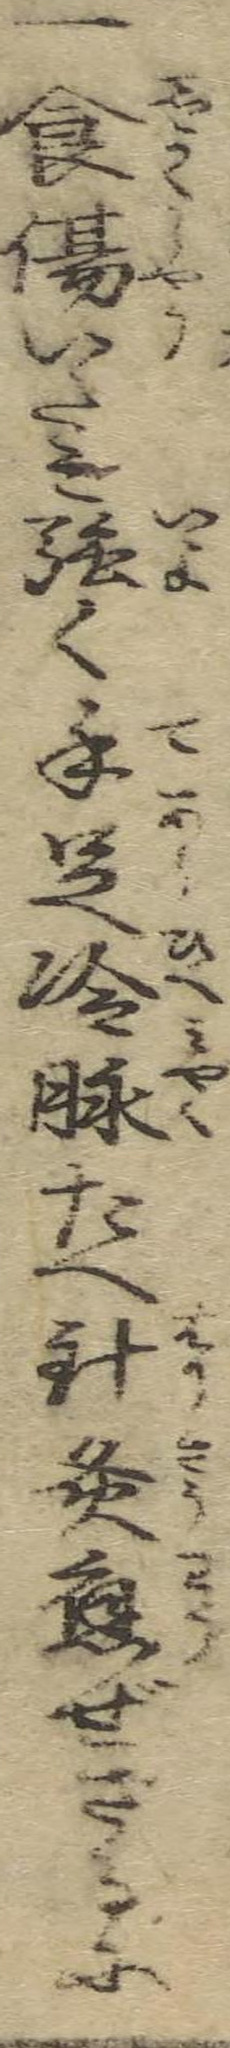一食傷いたみ強く手足冷脈たへ針灸応ぜざるに
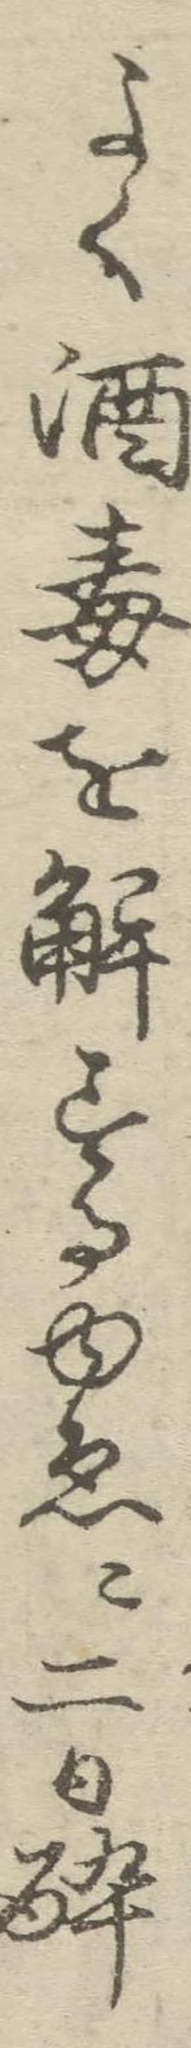よく酒毒を解するゆゑに二日酔
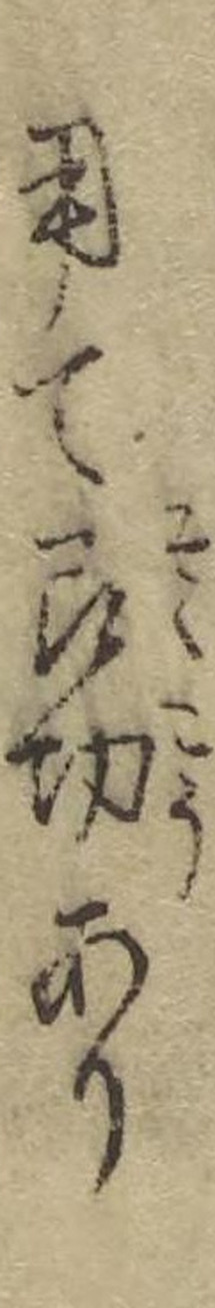用て即功あり
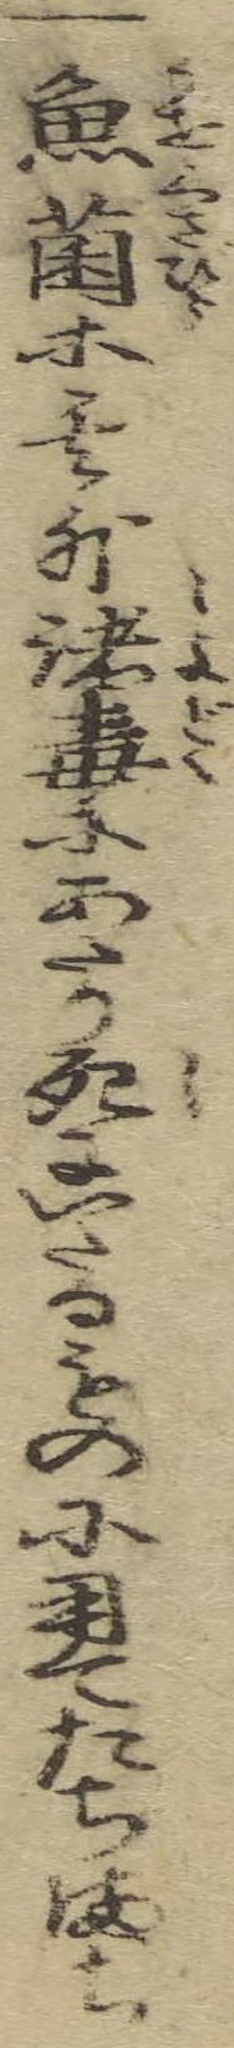一魚菌等其外諸毒にあたり死にいたるものに用てたちまち
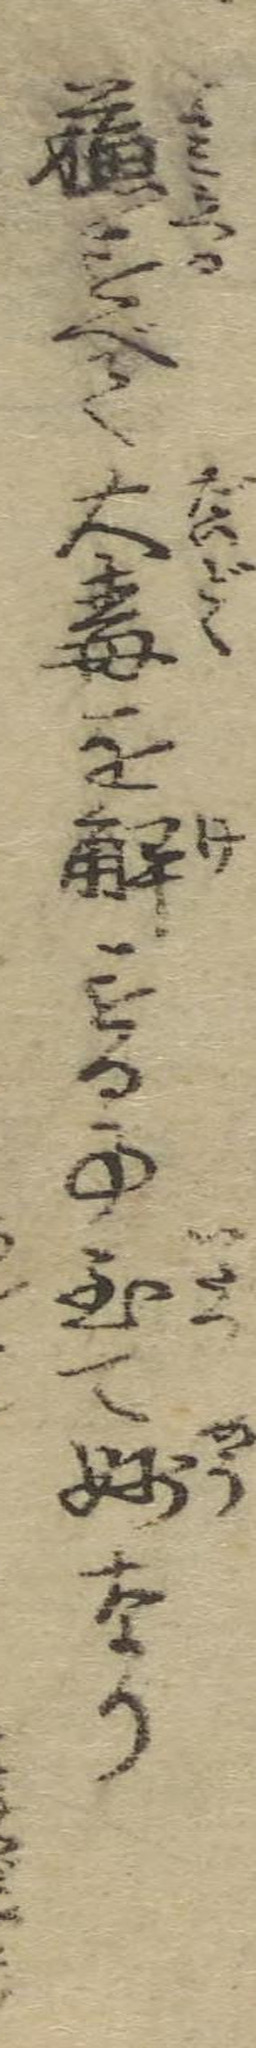蘇すべて大毒を解する事至て妙なり
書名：浪華薬種問屋能書張交帖. 二
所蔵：国立国会図書館 National Diet Library, JAPAN
